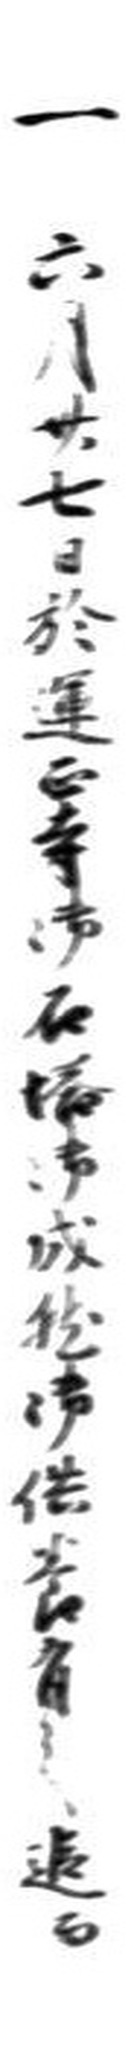一六月廿七日於運正寺御石塔御成就御供養有之追而
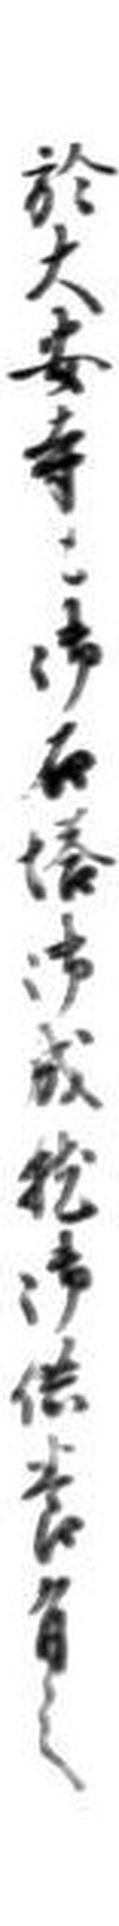於大安寺も御石塔御成就御供養有之
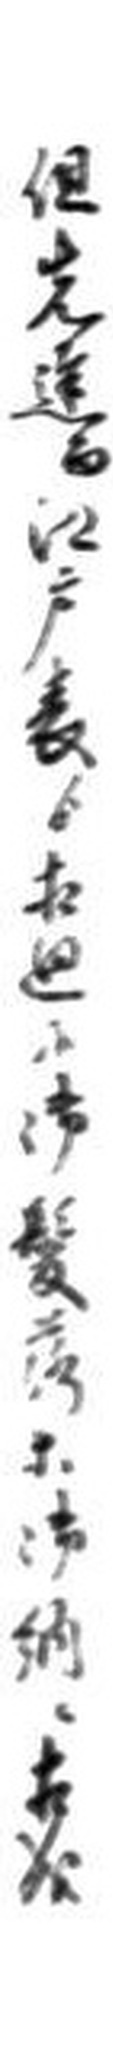但先達而江戸表ゟ相廻候御髪落等御納ニ相成

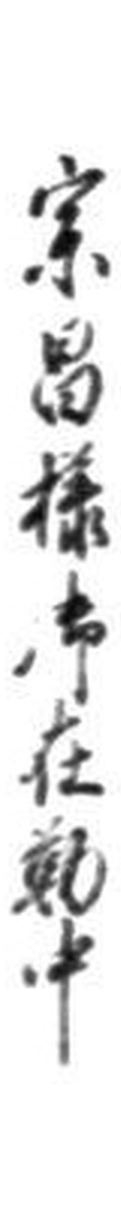宗昌様御在勤中
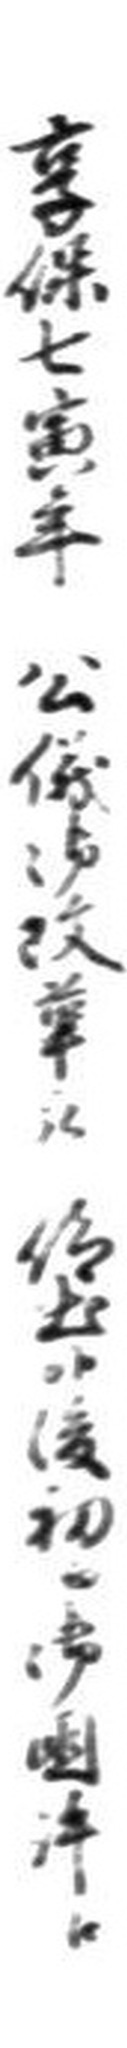享保七寅年公儀御改革被仰出候後初而御国許江
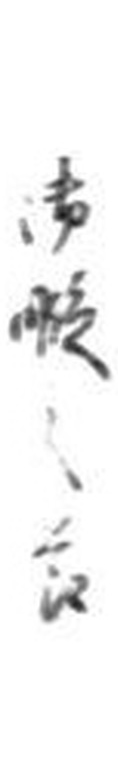御暇之節
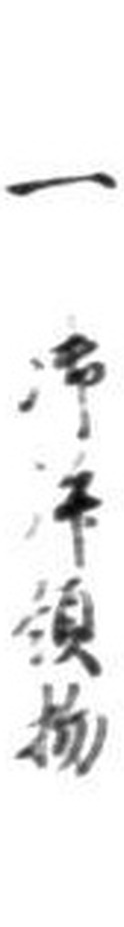一御拝領物
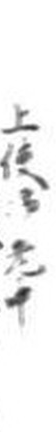上使御老中
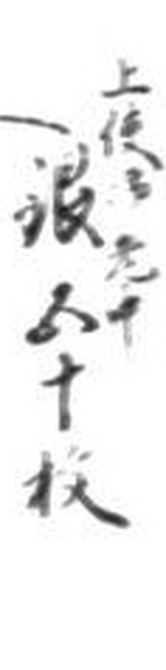銀五十枚
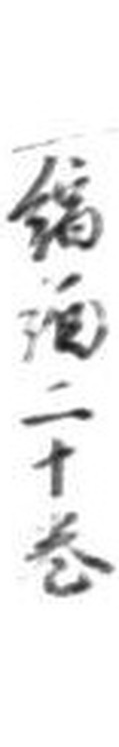縮緬二十巻
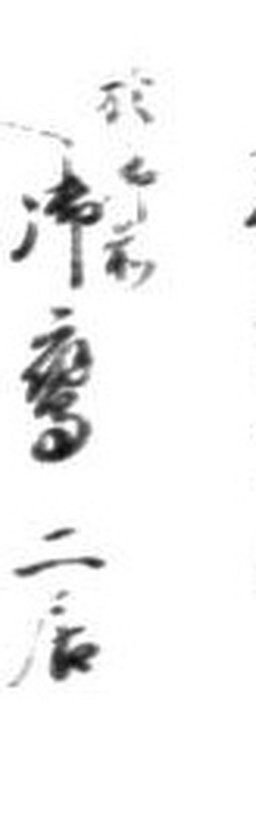御鷹二居
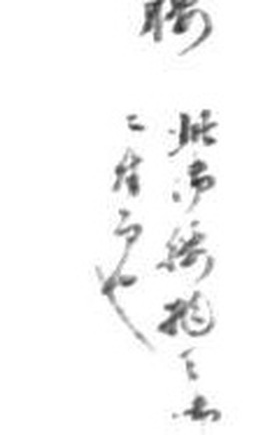ニ付而也

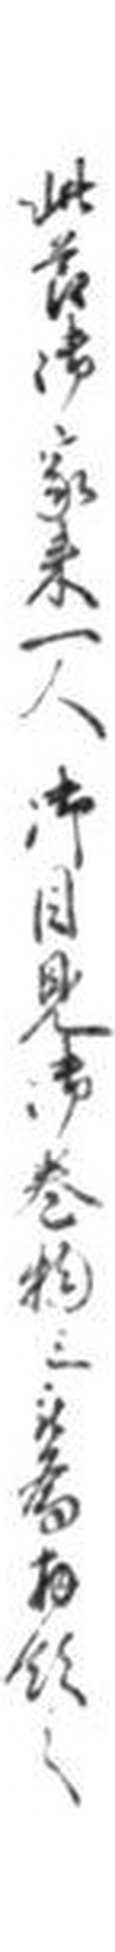此節御家来一人御目見御巻物三被為拝領之
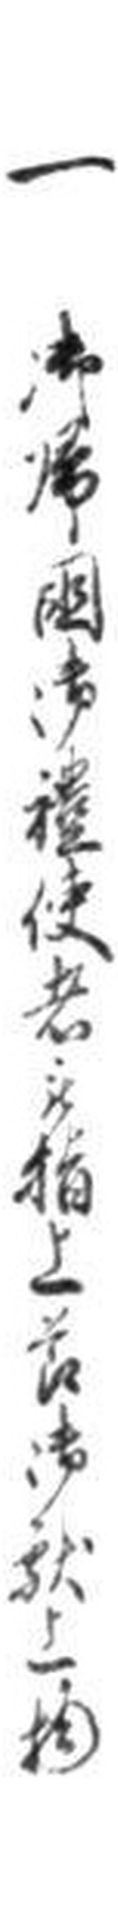一御帰国御礼使者被指上節御献上物
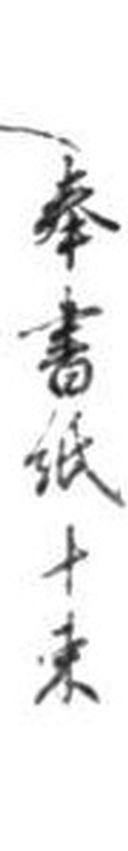奉書紙十束
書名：家譜 三十六 宗昌公 従享保八年到同九年
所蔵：福井県文書館 Fukui Prefectural Archives
